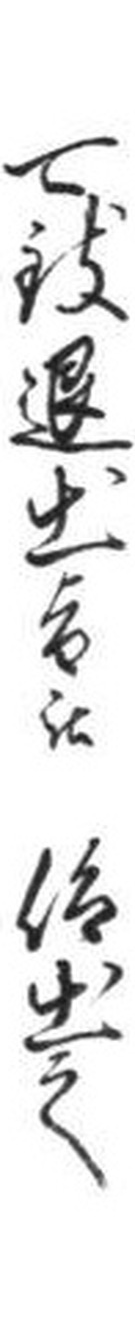可致退出旨被仰出之
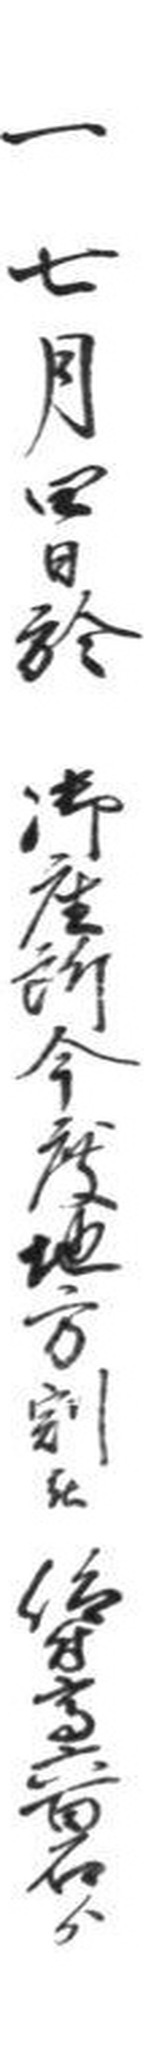一七月四日於御座所今度地方割被仰付高六百石ゟ
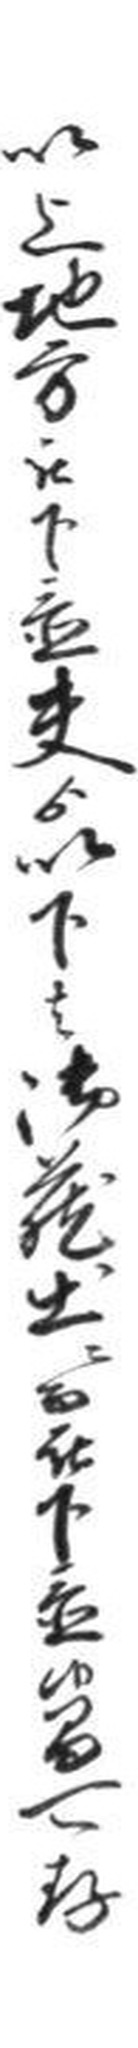以上地方被下置夫ゟ以下者御蔵出ニ而被下置候間可存
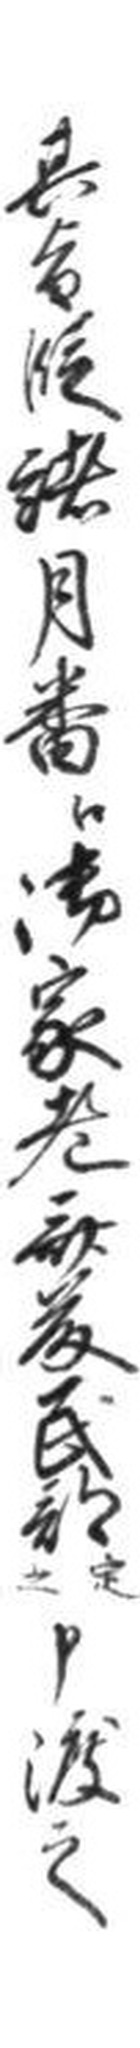其旨段諸月番江御家老斎藤民部定之申渡之
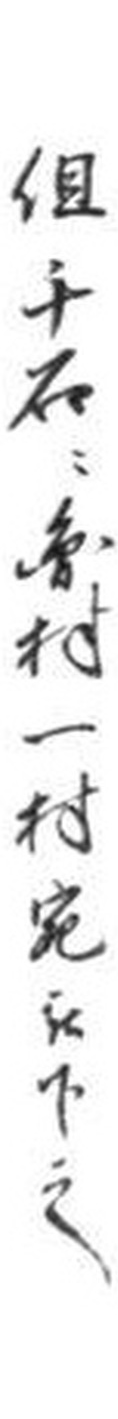但千石ニ円村一村宛被下
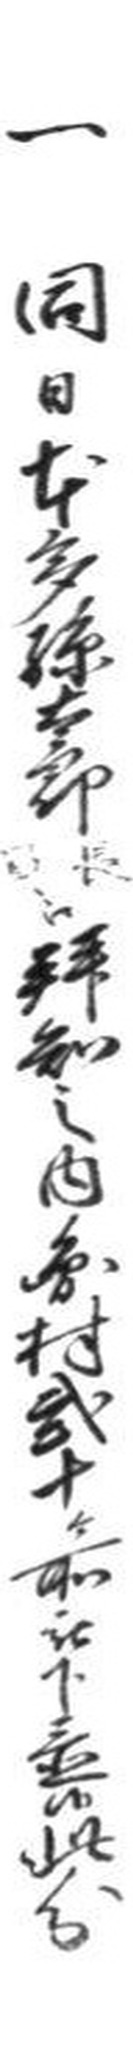一同日本多孫太郎長員拝知之内円村弐十ケ所被下置候此分
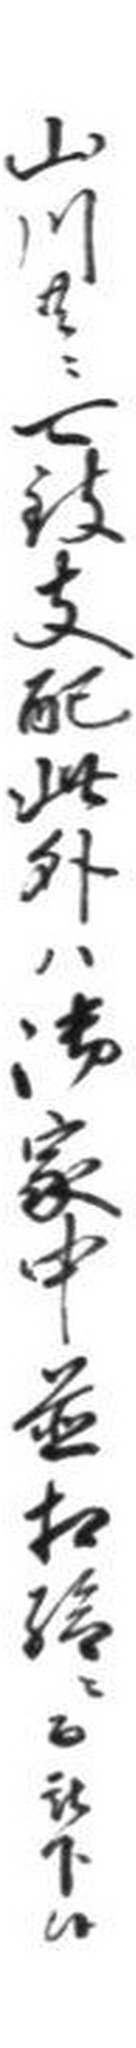山川共ニ可致支配此外ハ御家中並相給ニ而被下候
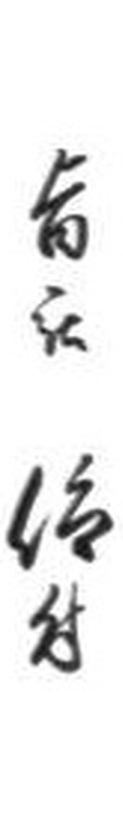旨被仰付
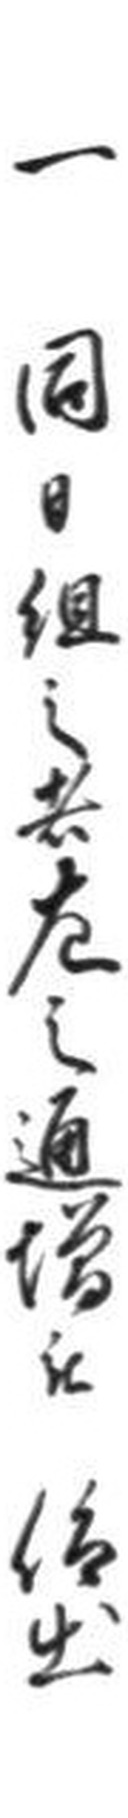一同日組之者左之通増被仰出
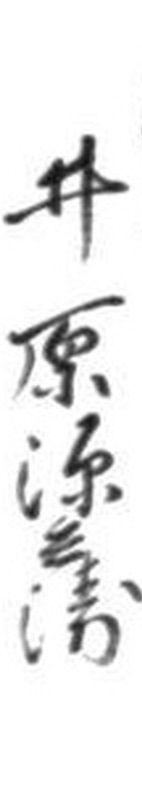井原源兵衛
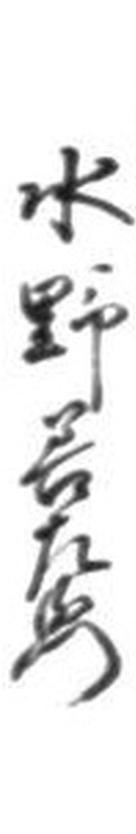水野善左衛門
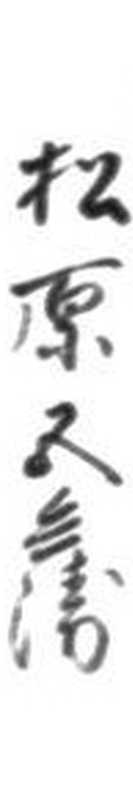松原五兵衛

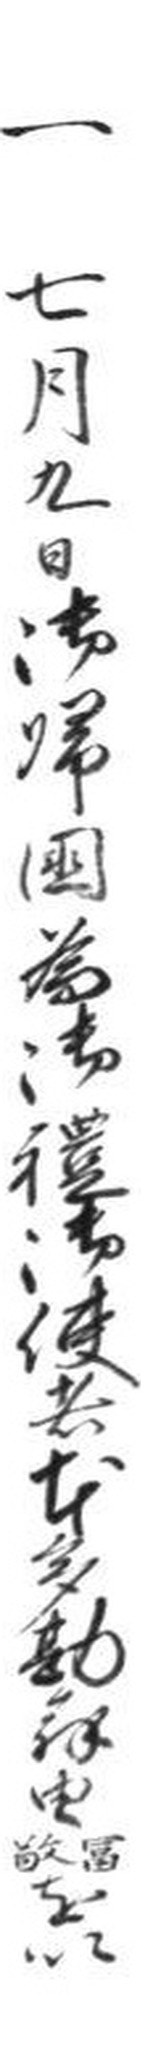一七月九日御帰国為御礼御使者本多勘解由冨敬を以
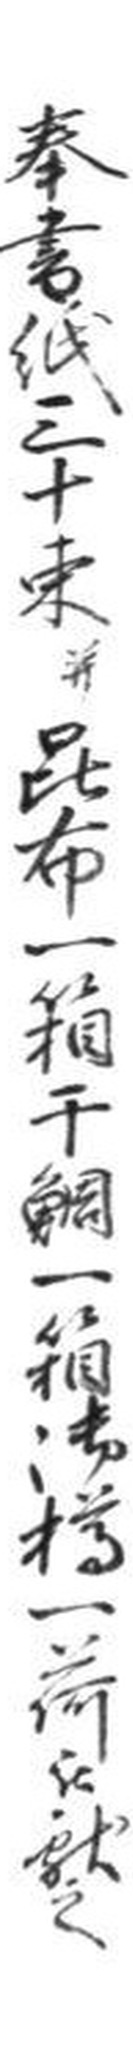奉書紙三十束并昆布一箱干鯛一箱御樽一荷被献之
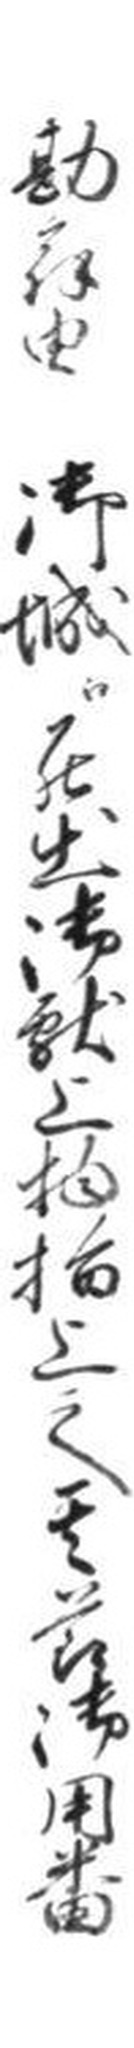勘解由御城江罷出御献上物指上之其節御用番
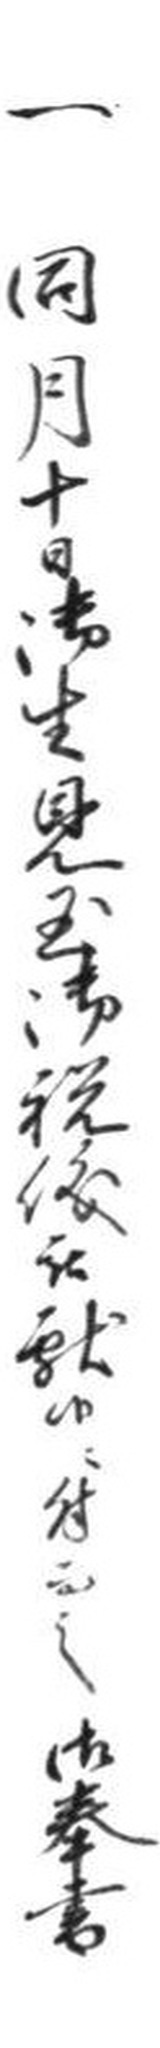一同月十日御生見玉御祝儀被献候ニ付而之御奉書
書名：家譜 十六 吉品公 従貞享三年閏三月到同四年
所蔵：福井県文書館 Fukui Prefectural Archives
